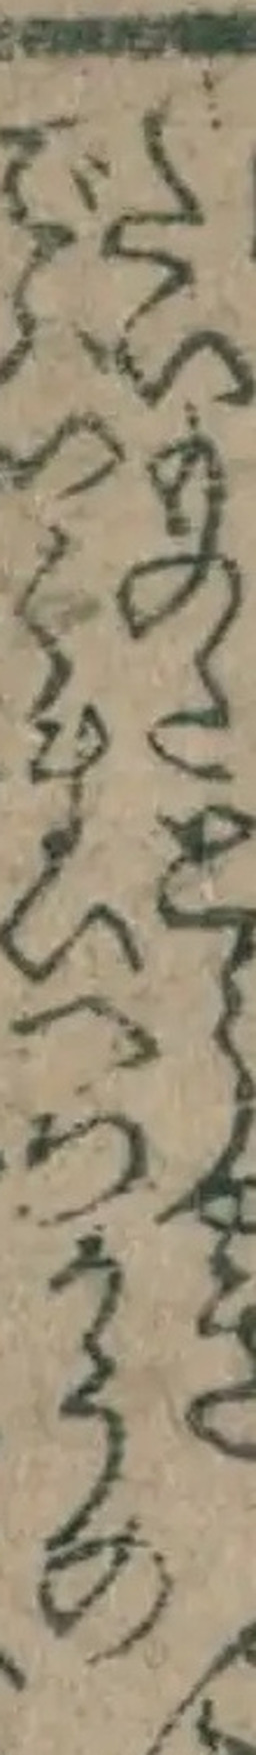ではいくまいへつかうの
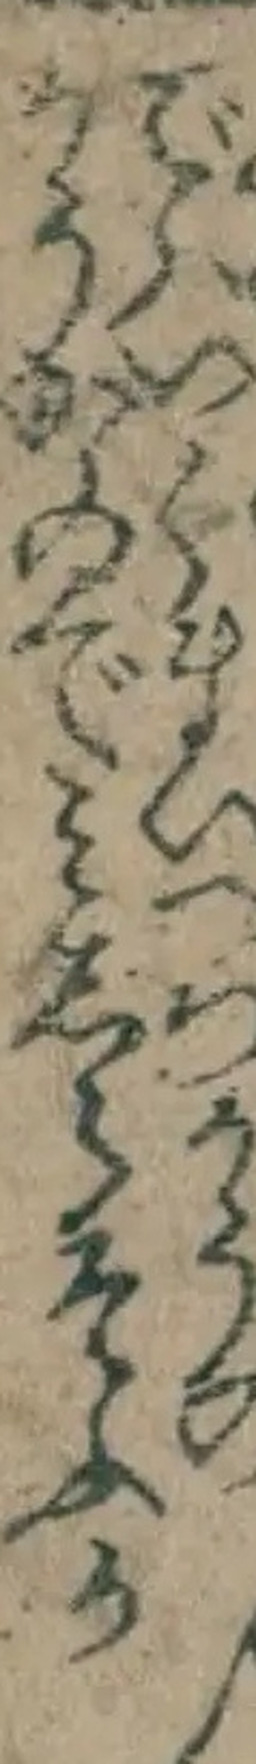かうかゐでみしらそふか

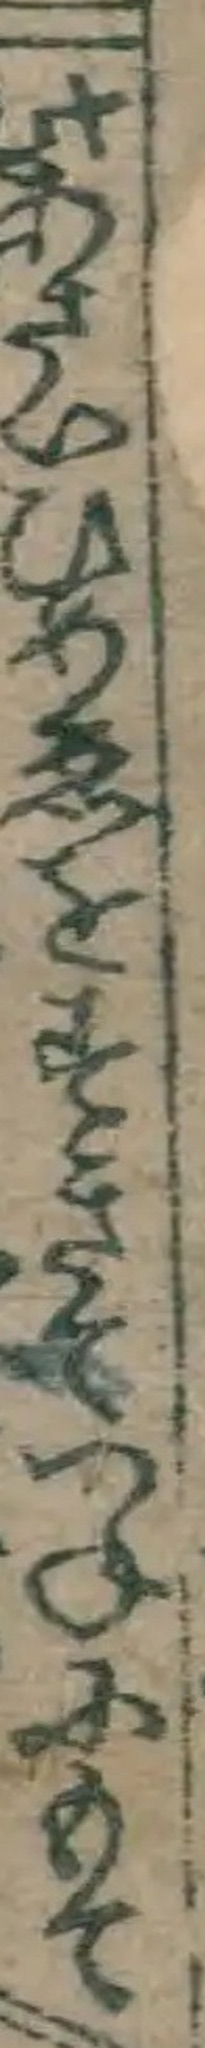このあさいひめゑをすきてつねにもて
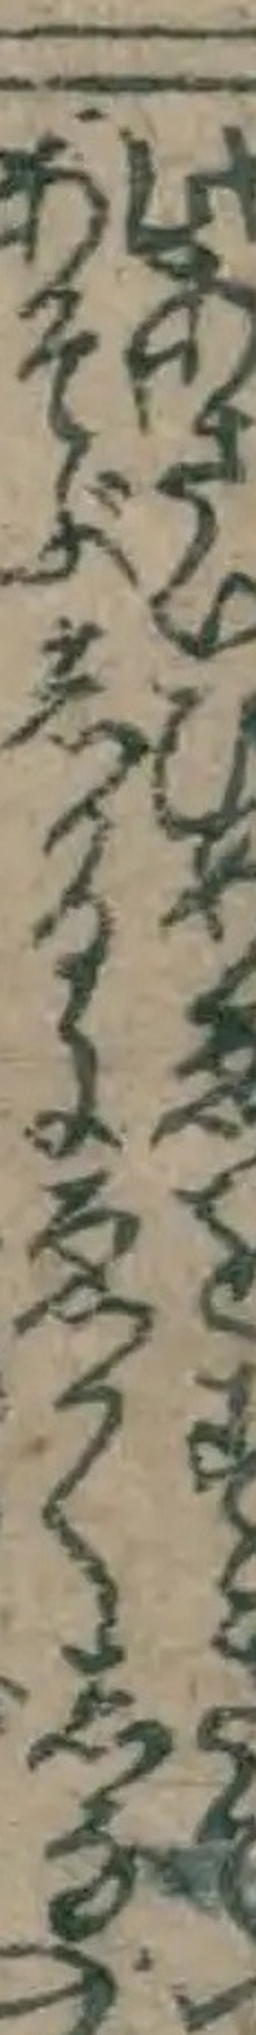あそぶしかるにゑかくしな〳〵
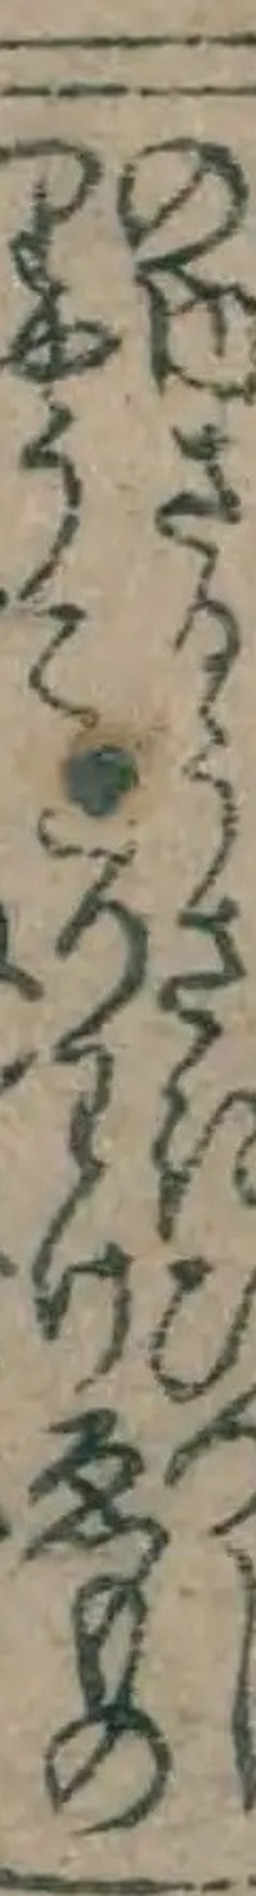りやうことりわけゑもの
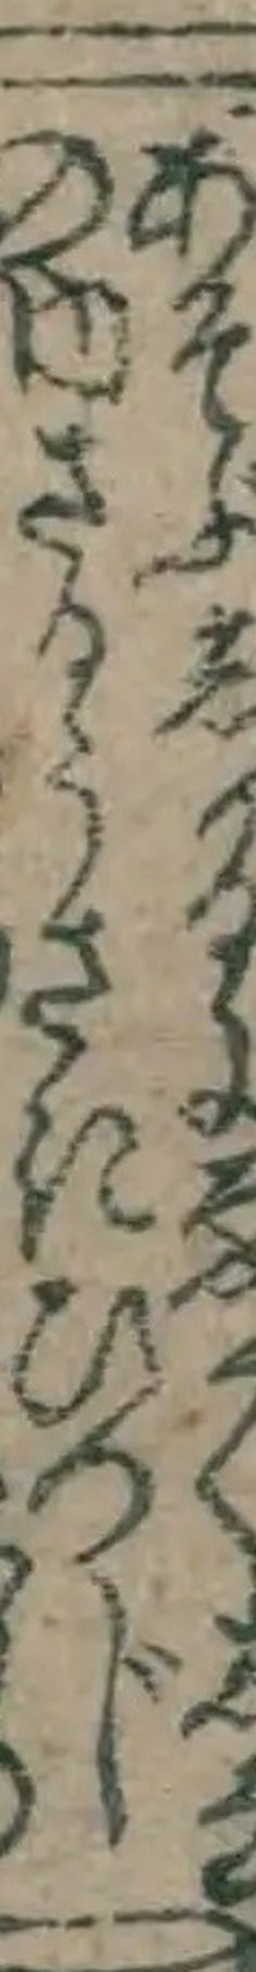のうちさるうさきひつじ
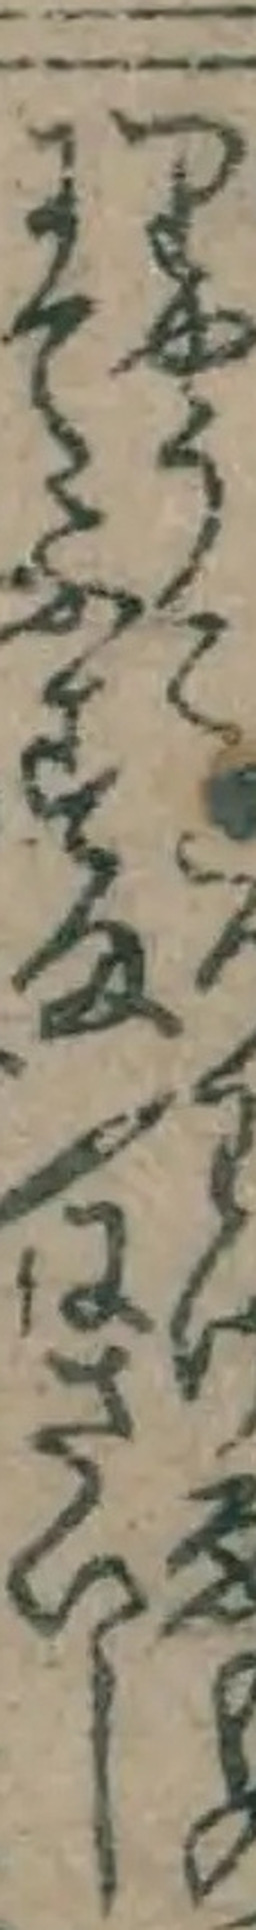にてふすまにさいし
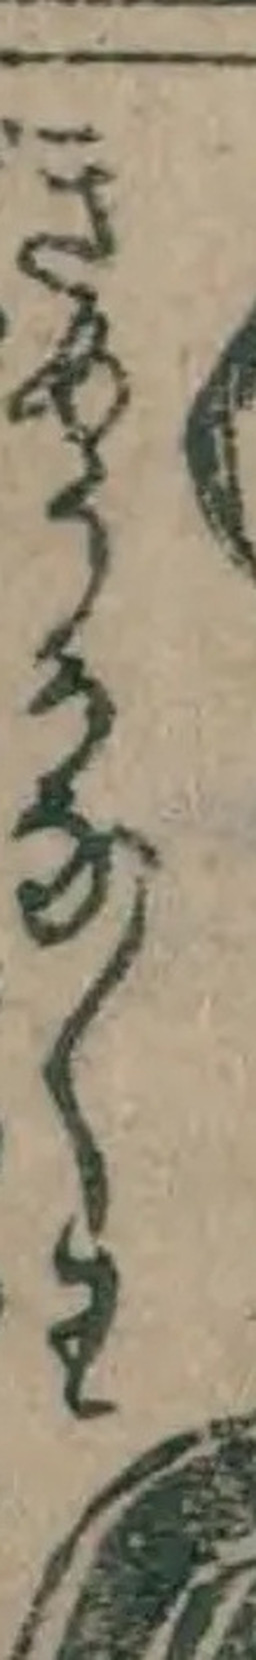きめうかな〳〵わ
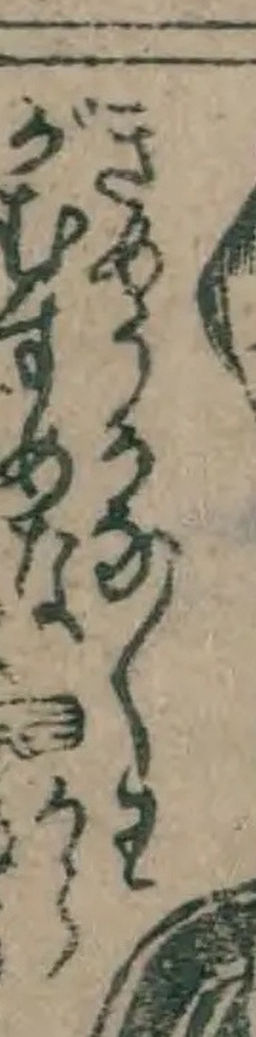がむすめなから
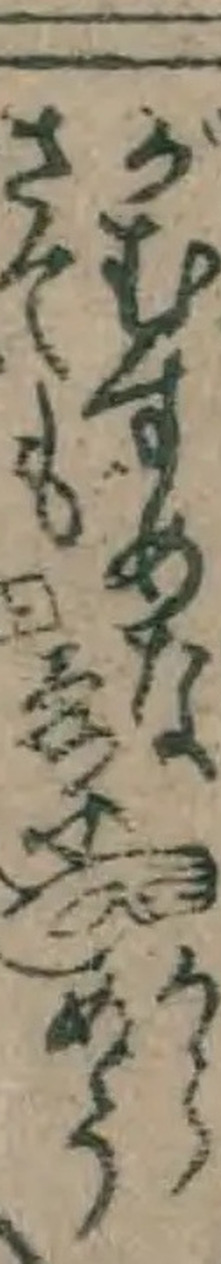さてもゑにめう
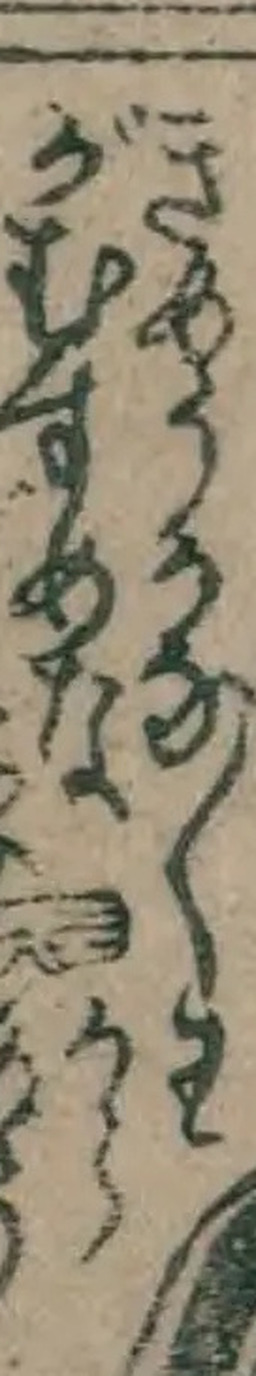がむすめなから
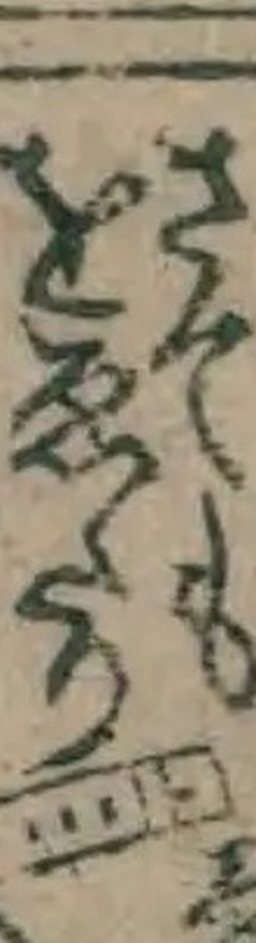をゑたり
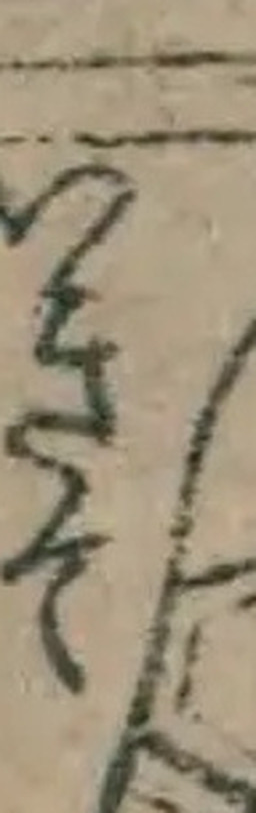いきて
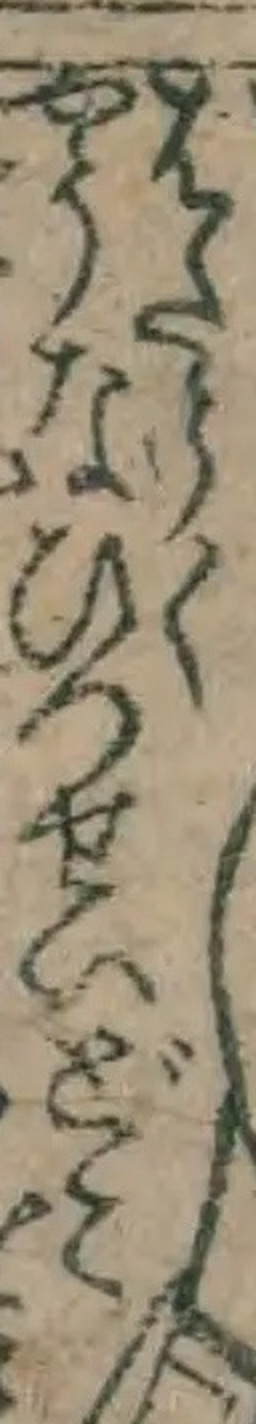やうなひつせいどこ
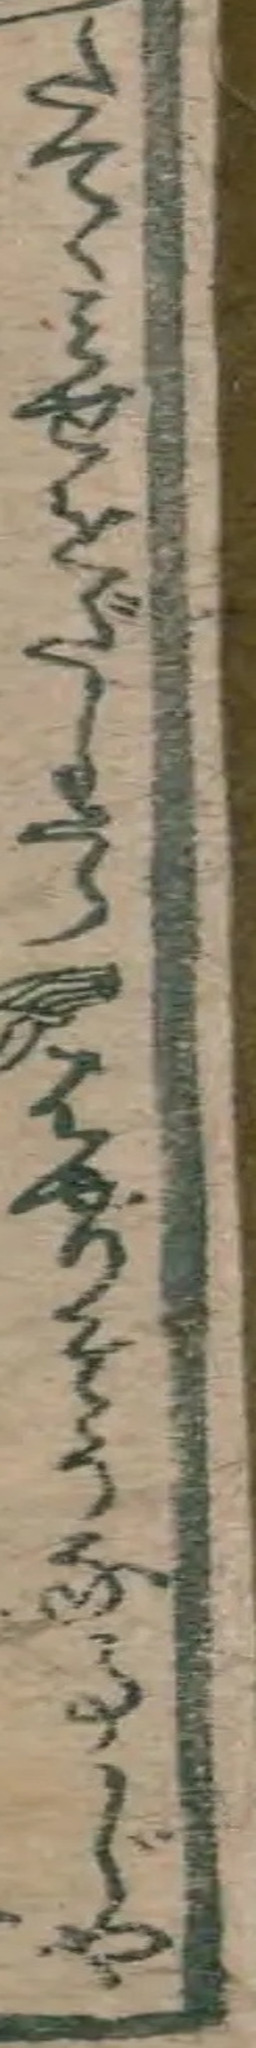たてゝみせをだしたらはやりそうな事じや
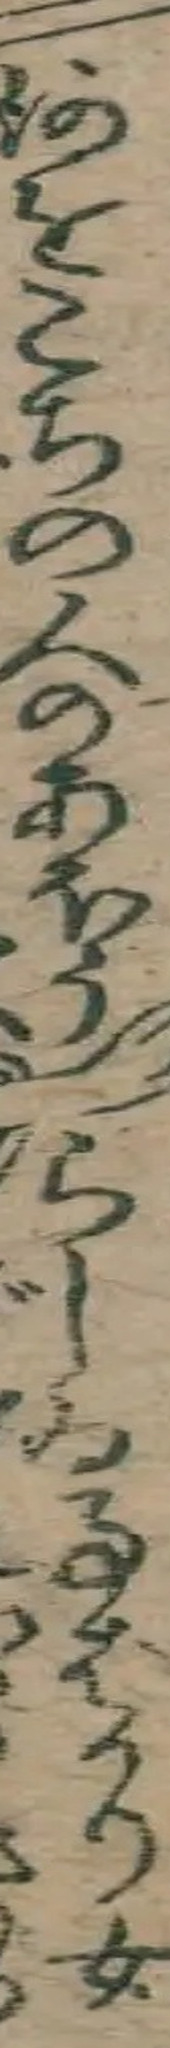何をこちの人のあほうらしゐ事ばかり女
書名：団十郎蓬芥伝
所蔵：国立国会図書館 National Diet Library, JAPAN
